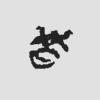冬
